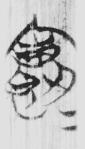{宀屮田食刀}=
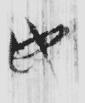女
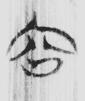容
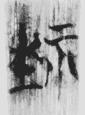{示𡉣}
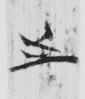之
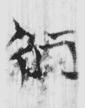凥
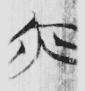亦
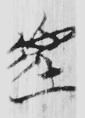𫊟
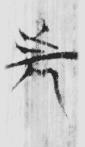先
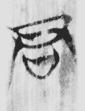君
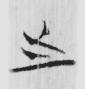之
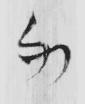力
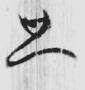也
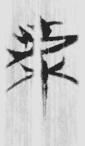枼
